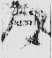凡
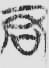君
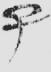子
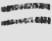二
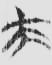夫
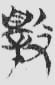○（罪）
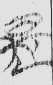是
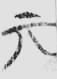亓（其）
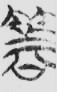箸（書）
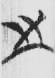之
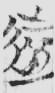旅（鲁）
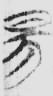昜（陽）
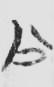公
